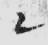乙
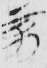亥
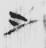之
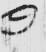日
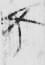不
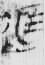𬨭（將）
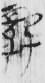龔
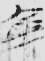倉
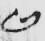㠯（以）
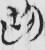○（廷）
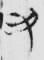阩
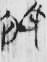門
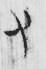又（有）
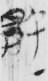敗
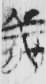義
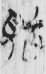覩
